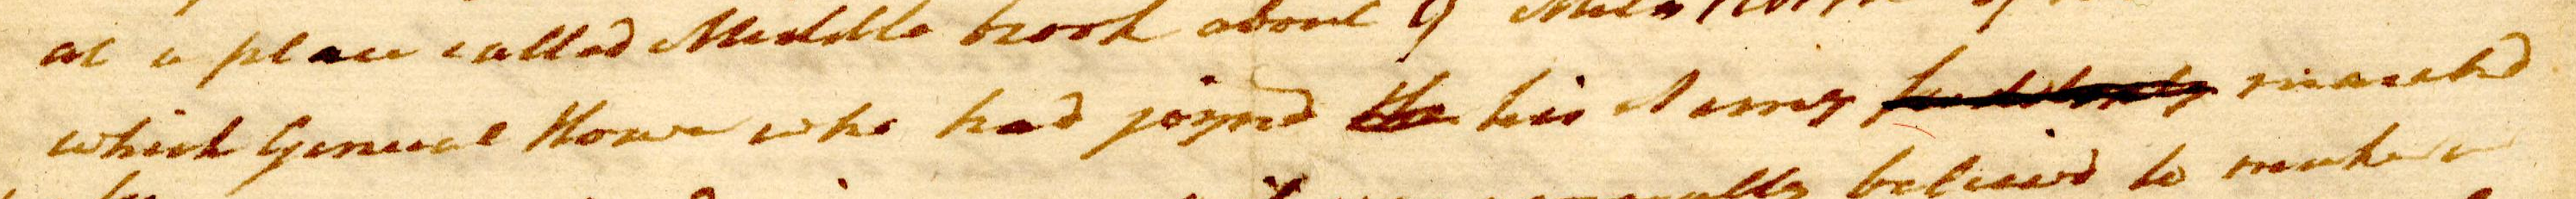which General Howe who had joind [___] his Army [_________] marched
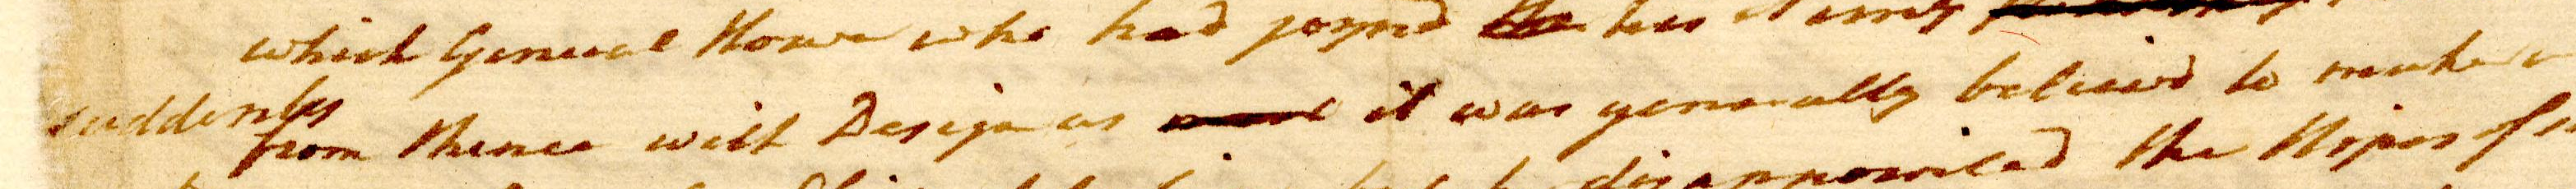Suddenly from thence with Design as [___] it was generally believed to make
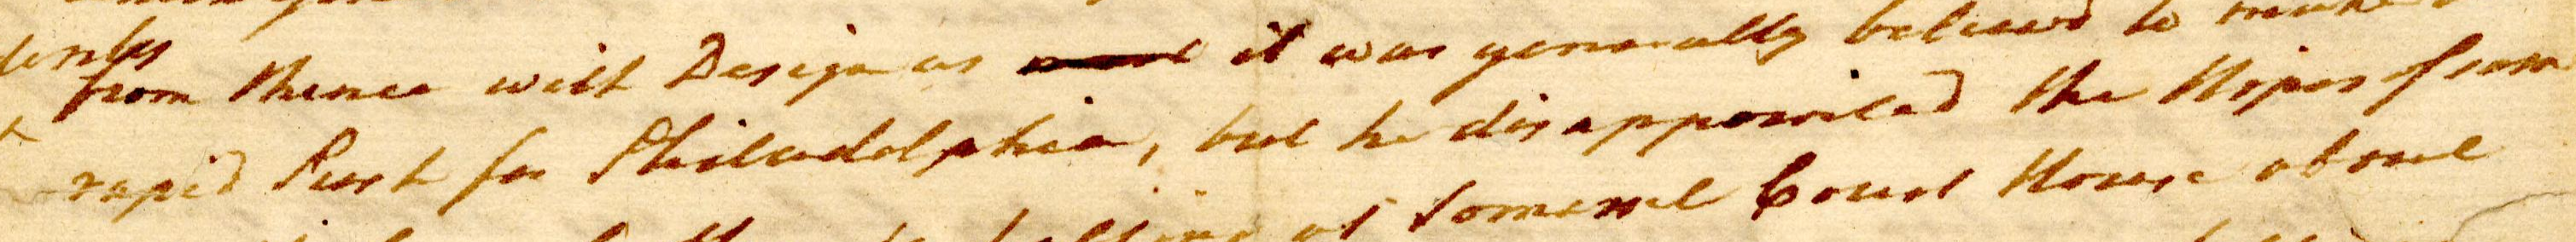rapid Port for Philadelphia, but he disappointed the Vipers from
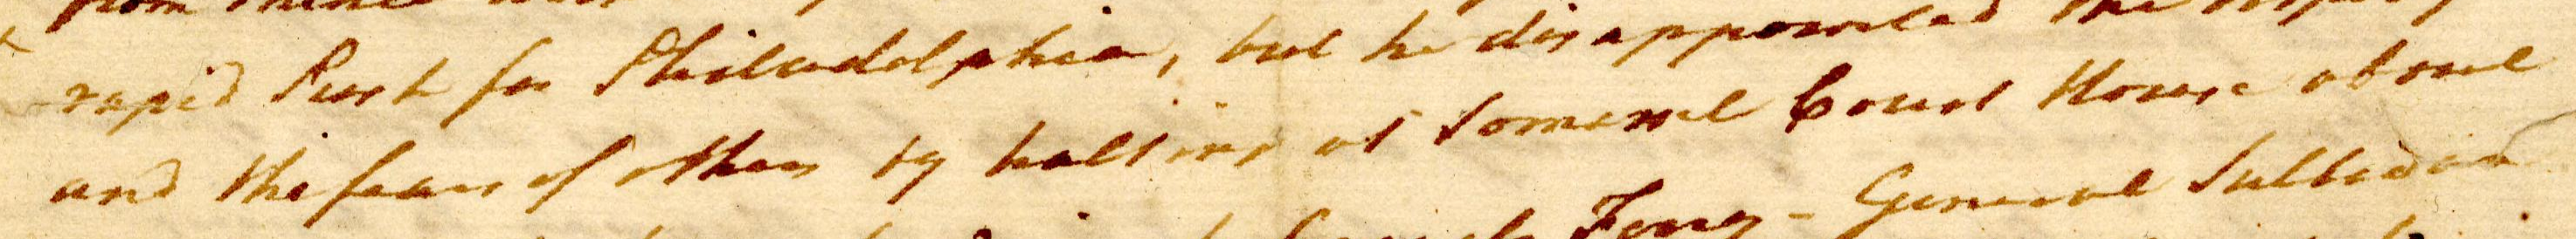and the fears of other by halling of somerset Court House about
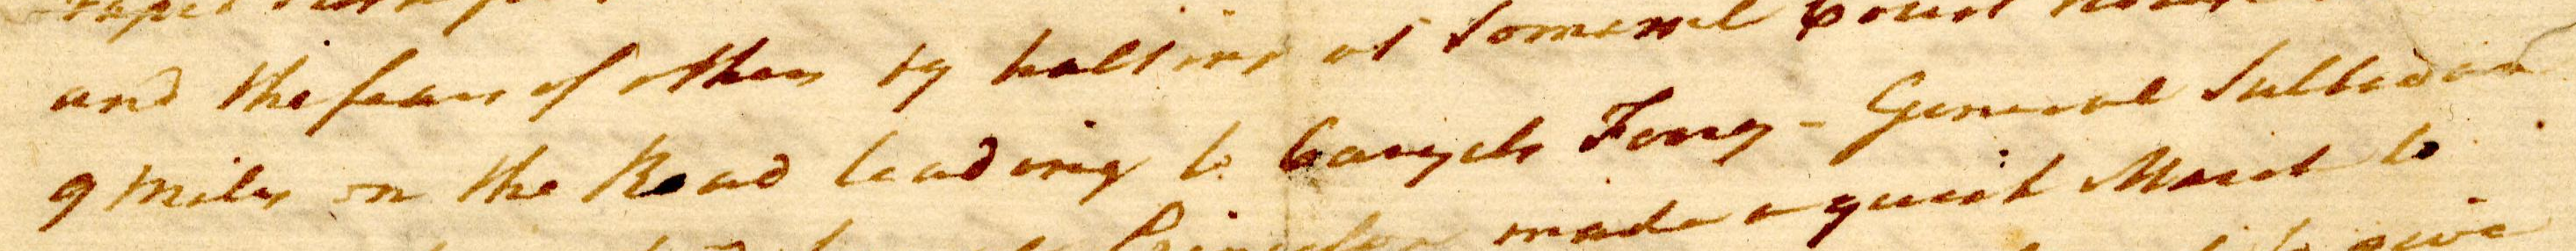9 miles on the Road leading to Caryels Ferry- General Sullivan
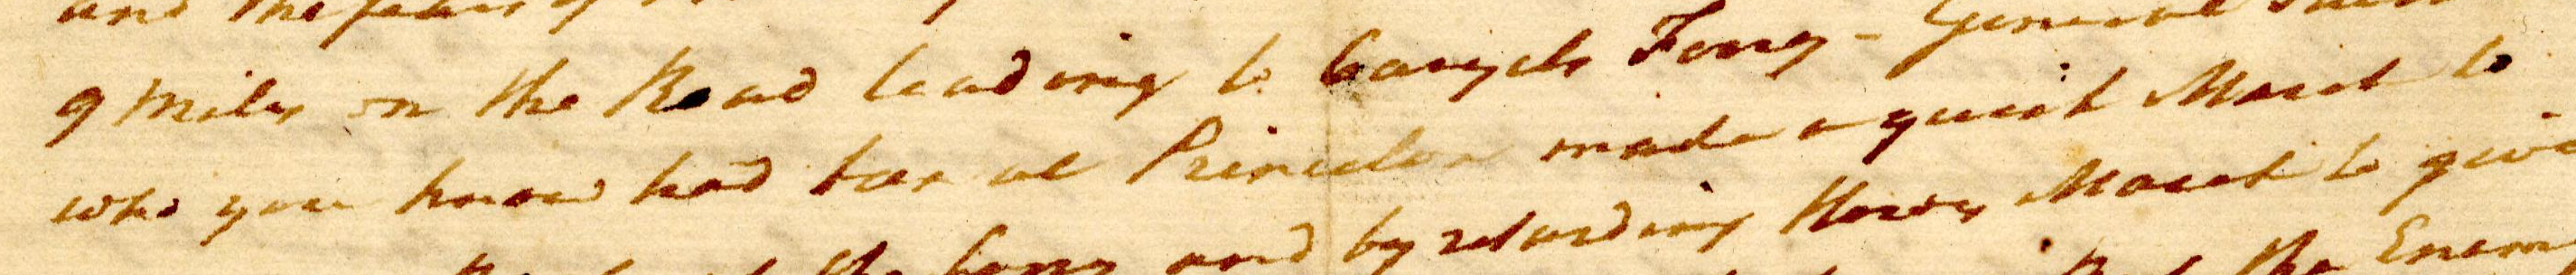who you know had for at Princeton made a quick March to
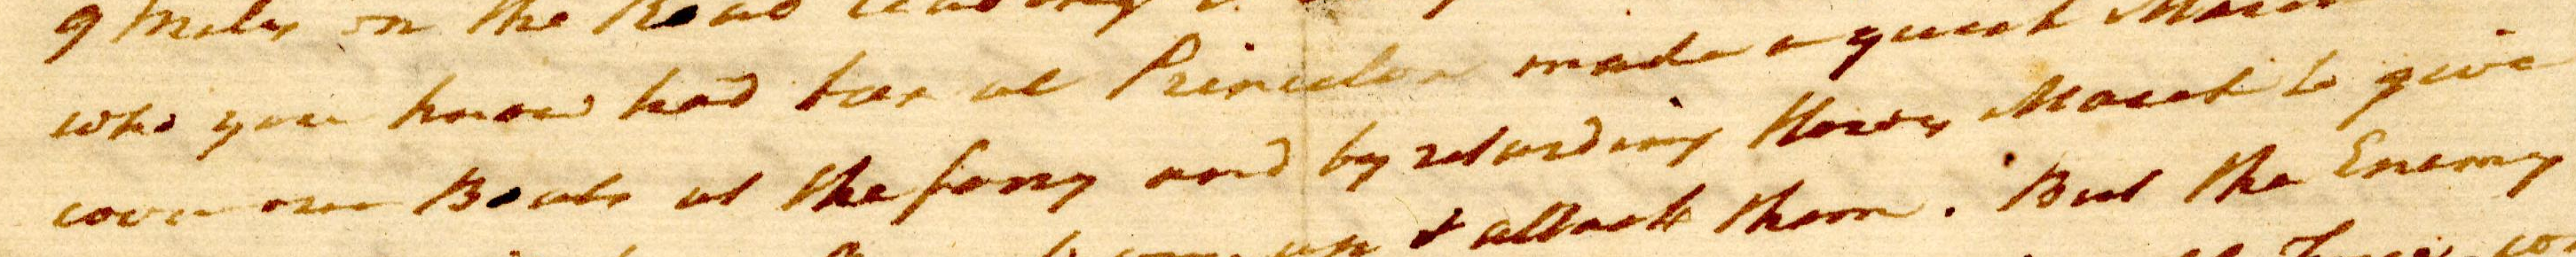cover our Boats at the ferry and by valuing How next to give
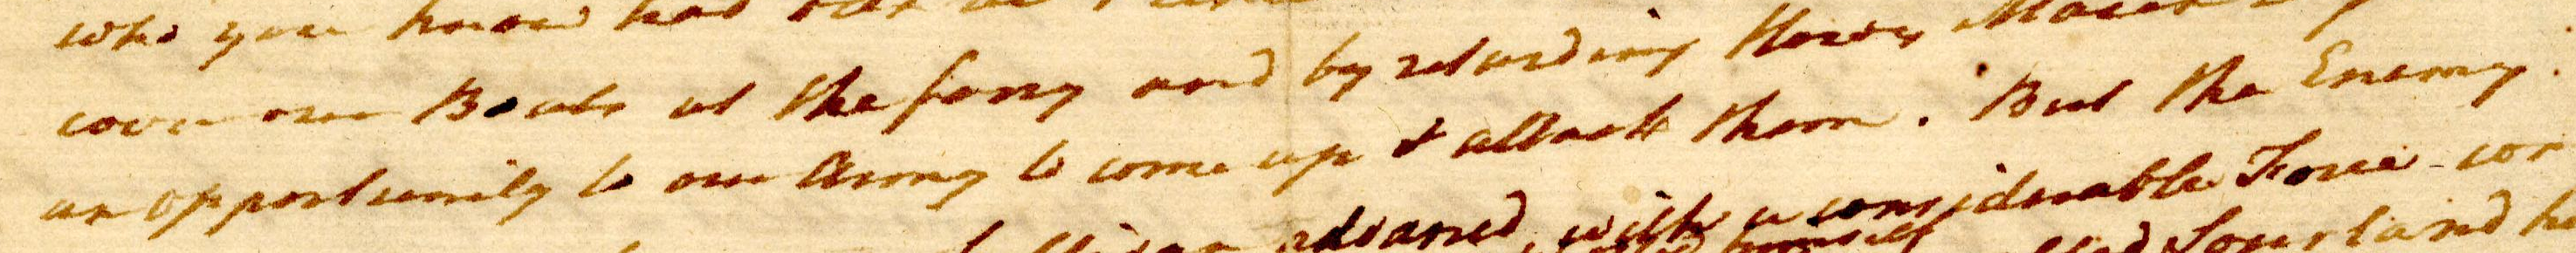an opportunity to our Army to come up & attack them. But the Enemy
